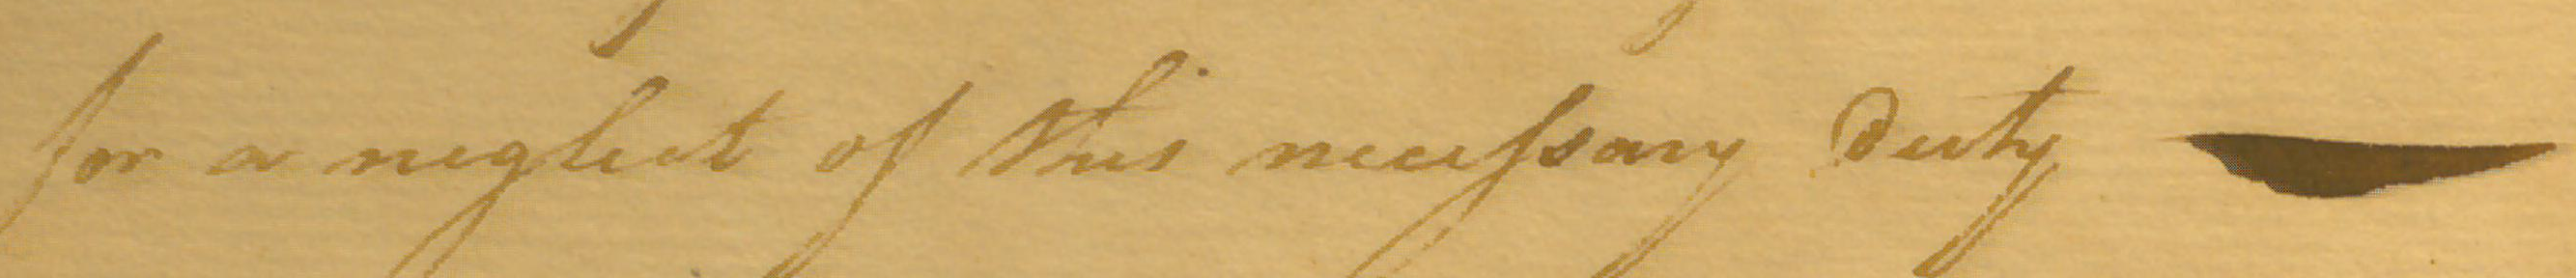for a night of this necessary duty-
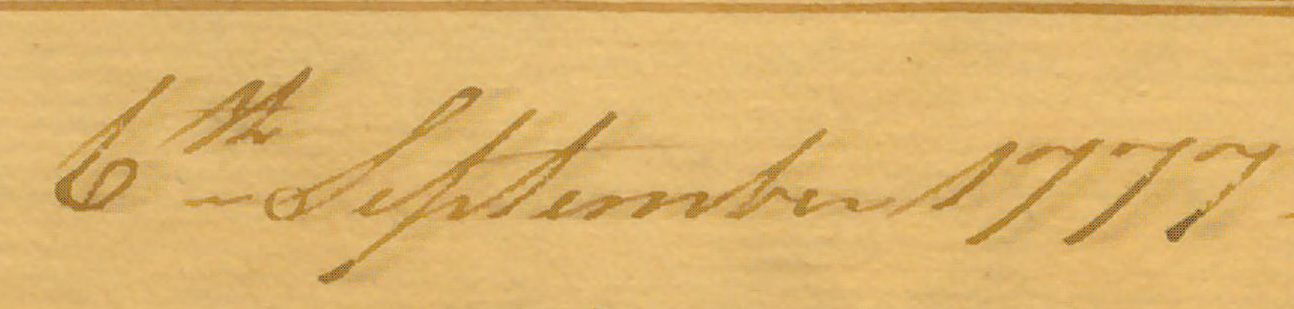6^th September 1777
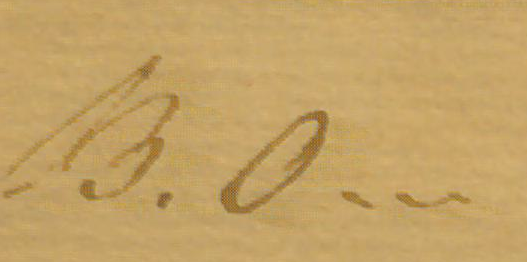B.O.-
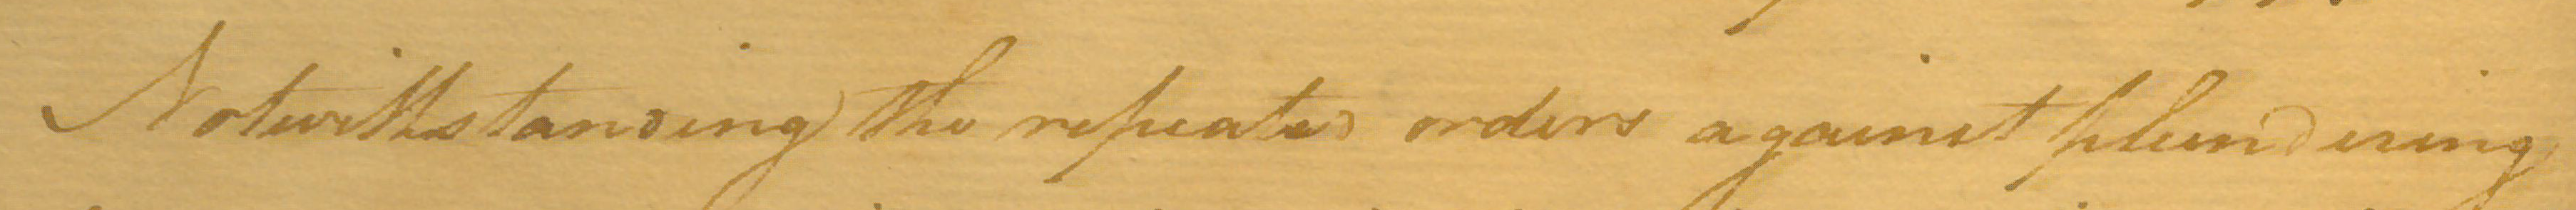Notwithstanding the repeated orders against plundering
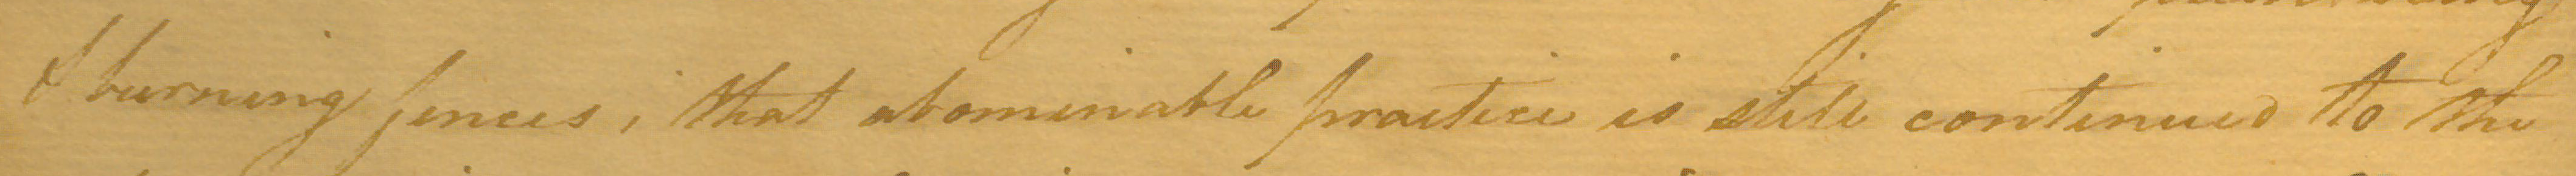& burning fences, that abominable practice is still continued to the
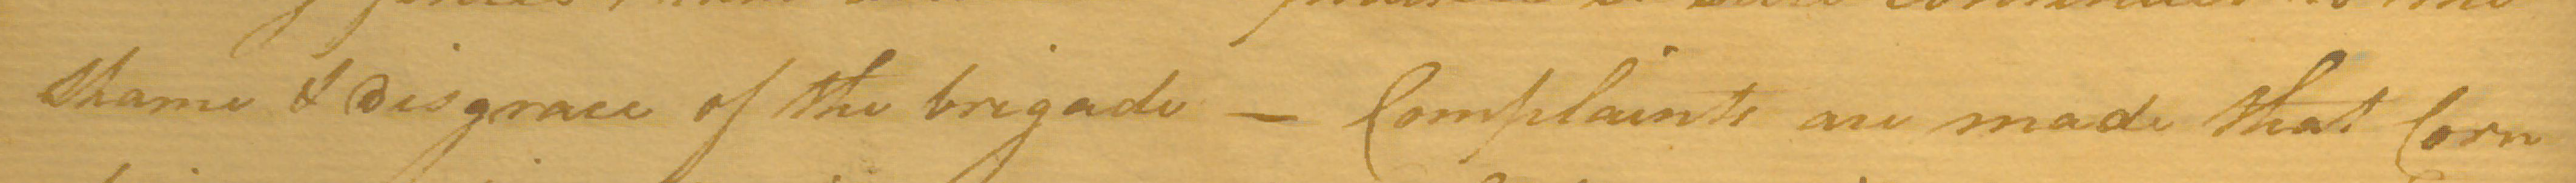shame & disgrace of the brigade- Complaints are made that Corn
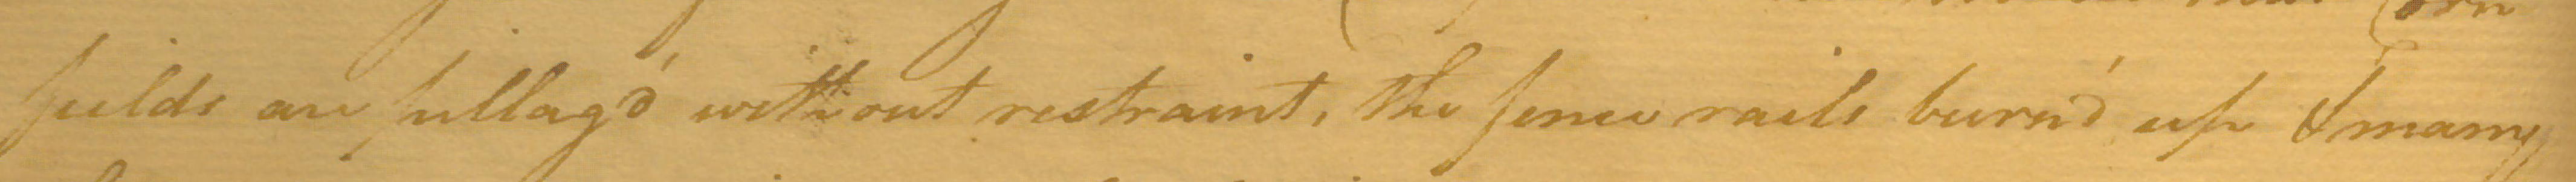fields are pillag'd without restraint, the fence rails burn'd up & many
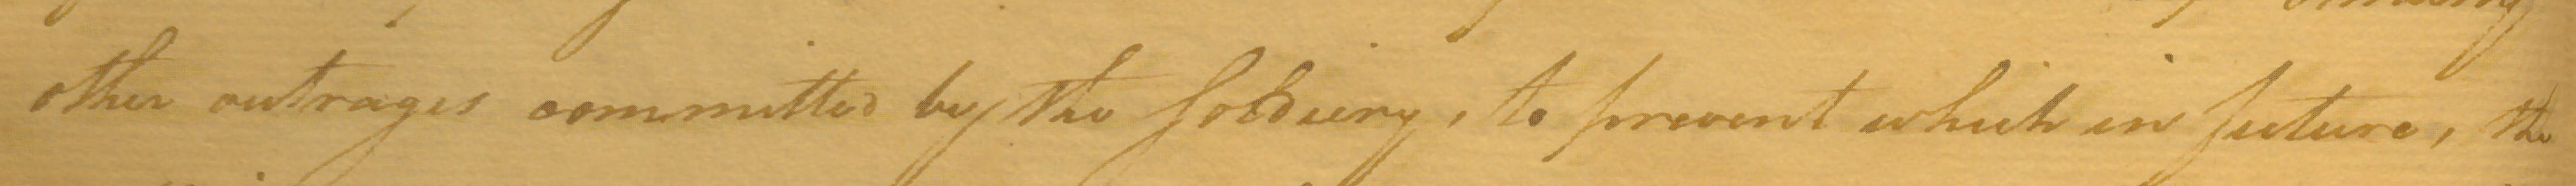other outrages committed by the Soldiery, to prevent which in future, the
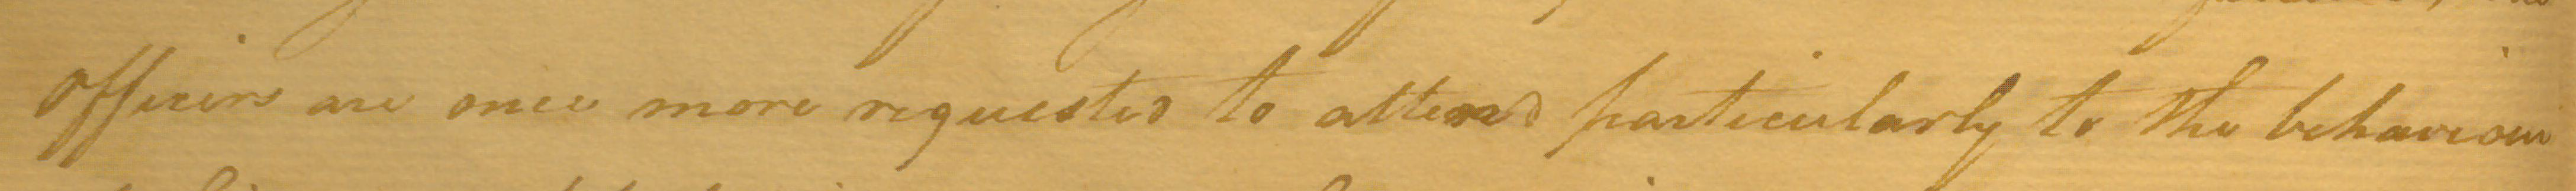Officers are once more requested to attend particularly to the behaviour
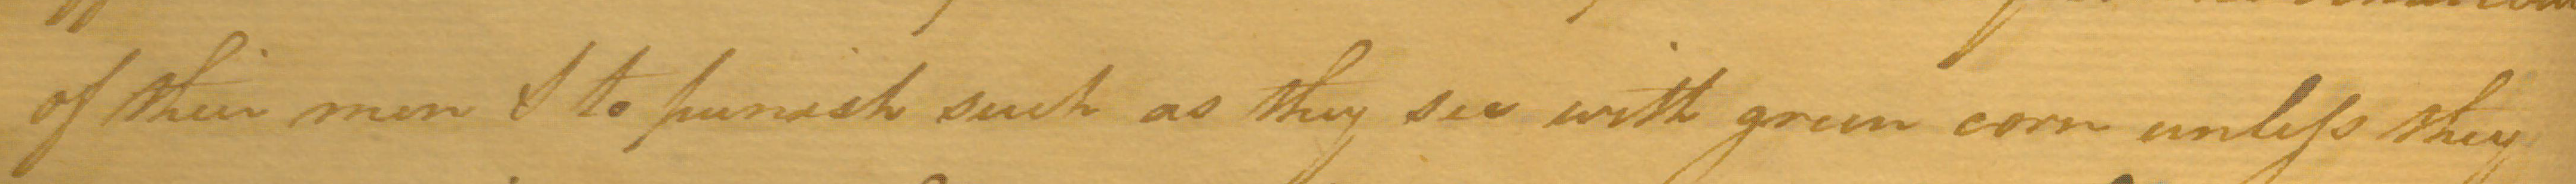of their men & to punish such as they see with green corn unless they
